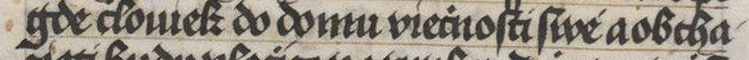gde ċlouiek do domu víeċnoſti ſwé a obcha¬
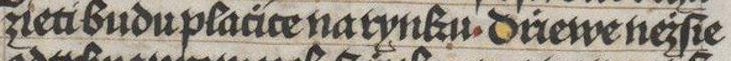zíetí budu plaċíce na rynku.Dṙiewe neżſie
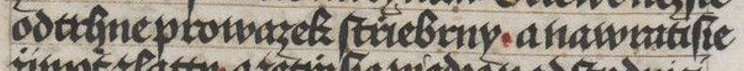odtrhne prowazek ſtṙiebrny.a nawrati ſie
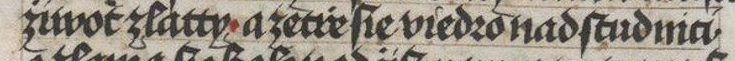żiwot zlatty.a zetṙe ſie viedro nad ſtudnicí.
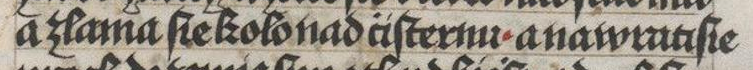a zlama ſie kolo nad ċiſternu. a nawrati ſie
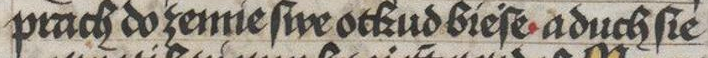prach do zemie ſwe otkud bieẛe.a duch ſie
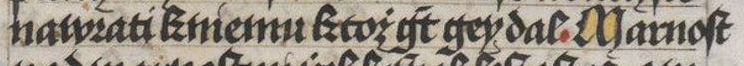nawrati k niemu ktoż ḡt gey daſ. Marnoſt
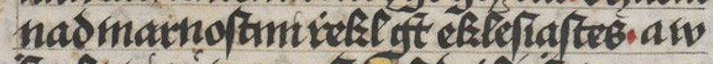nad marnoſtmi ṙekl ḡt ekleſiastes.a w¬
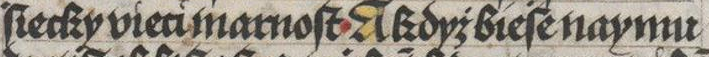ẛiecky vieci marnoſt. A kdyż bíeẛe naymu¬
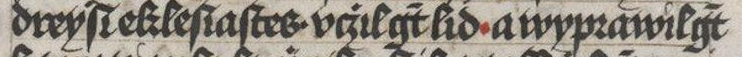dreyẛí ekleſiaſtes.vcżil ḡt lid.a wyprawil ḡt
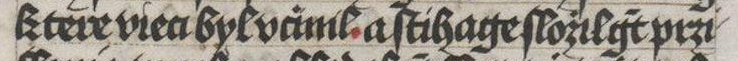ktere vieci byl vċinil.a ſtíhage ſlożil ḡt przi¬
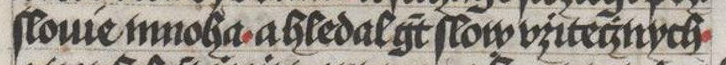ſlouíe mnoha.a hledal ḡt ſlow vżitecżnych.
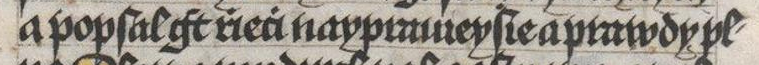a popſal ḡt ṙieċi nayprauieyẛie a prawdy pl¬
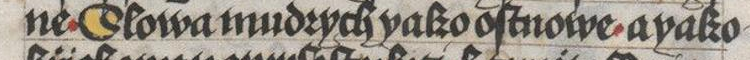ne. Slowa mudrych yako oſtnowe.a yako
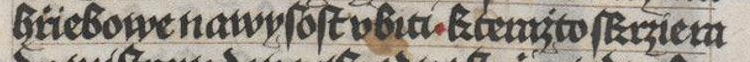hṙiebowe nawyſoſt vbití.kterażto ſkrzie ra¬
